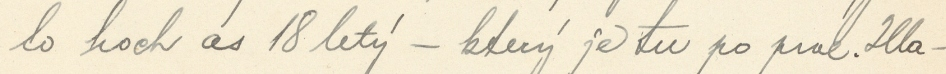to hoch as 18 letý - který je tu po prvé. Hla-
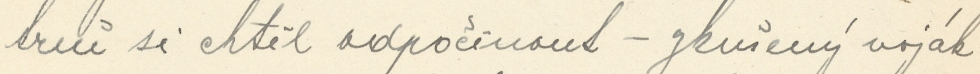trně si chtěl odpočinout - zkušený voják
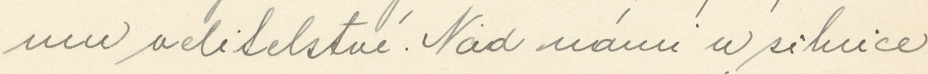mu velitelství. Nad námi u silnice
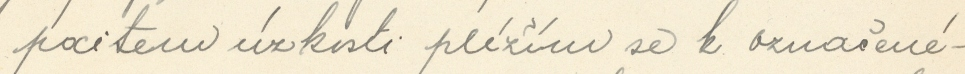pocitem úzkosti plížím se k označené-
